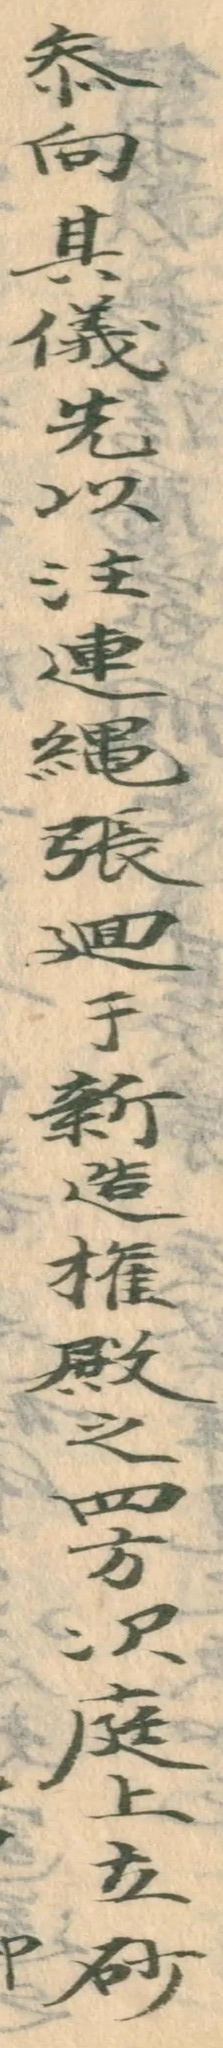参向其儀先以注連縄張廻于新造椎殿之四方次庭上立砂
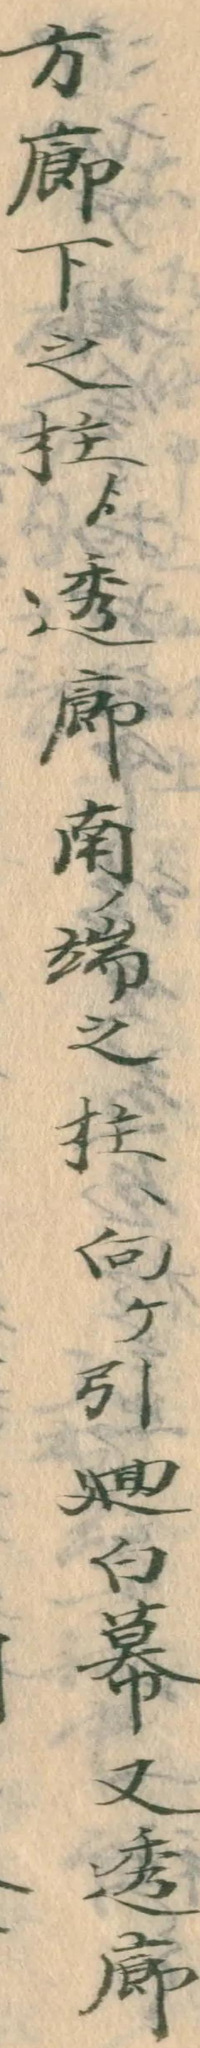方廊下之柱ゟ透廊南端之柱へ向ケ引廻白幕又透廊
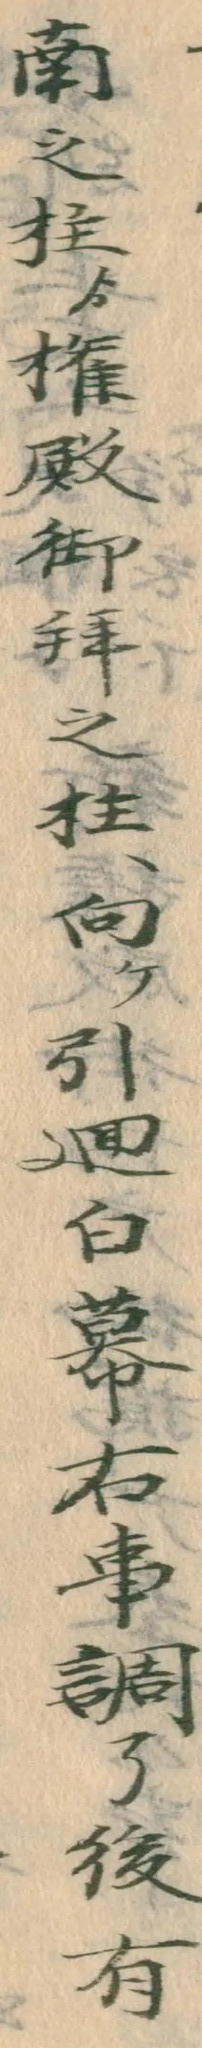南之柱ゟ権殿御拝之柱へ向ケ引廻白幕右事調了後有
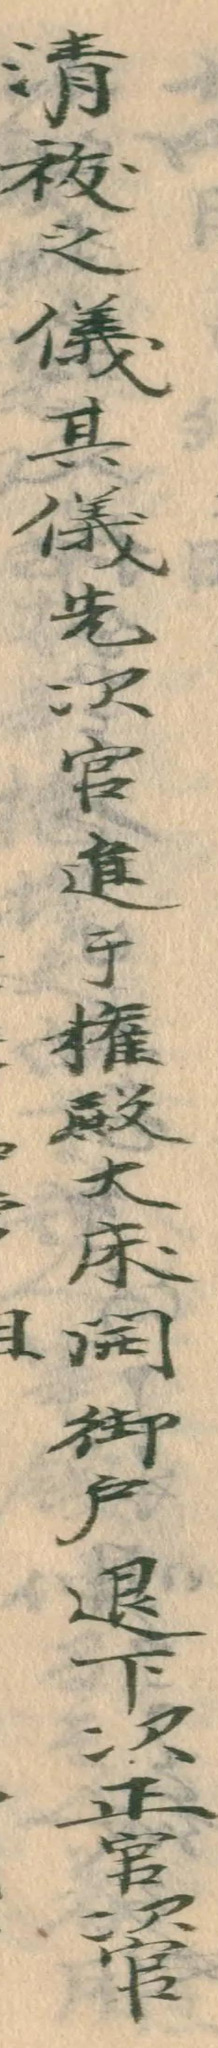清祓之儀其儀先次官進于権殿大床開御戸退下次正官次官
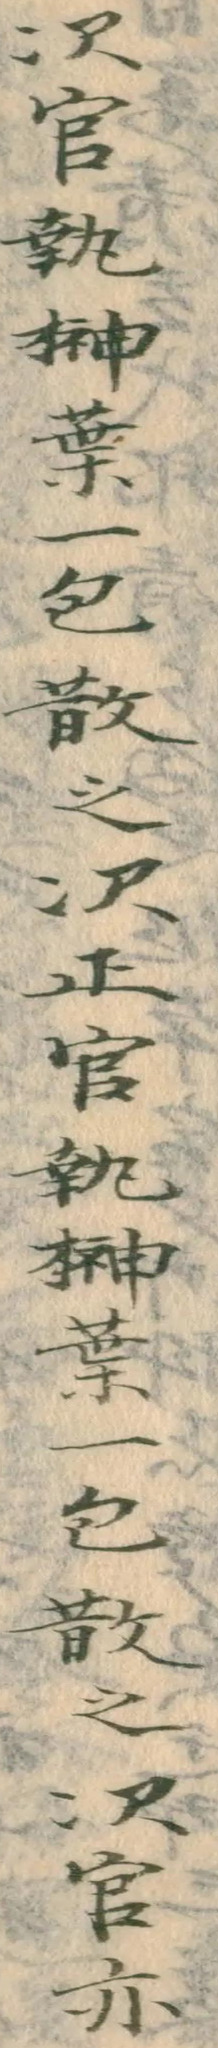次官執榊葉一包散之次正官執榊葉一包散之次官亦
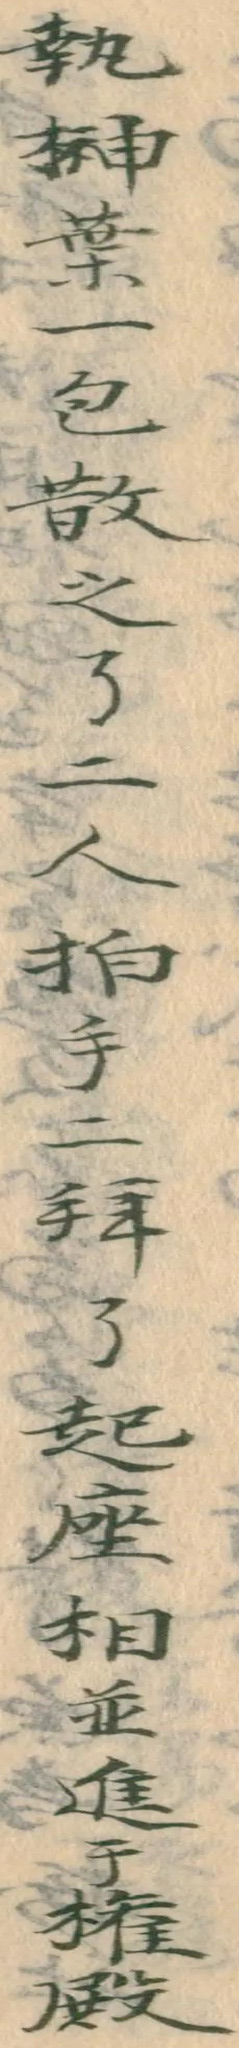執榊葉一包散之了二人拍手二拝了起座相並進于権殿
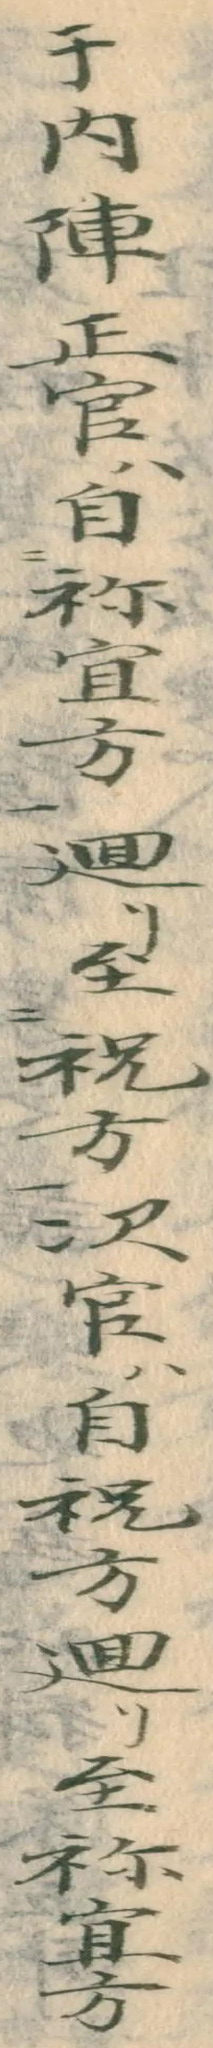于内陣正官ハ自祢宜方廻リ至祝方次官ハ自祝方廻リ至祢宜方
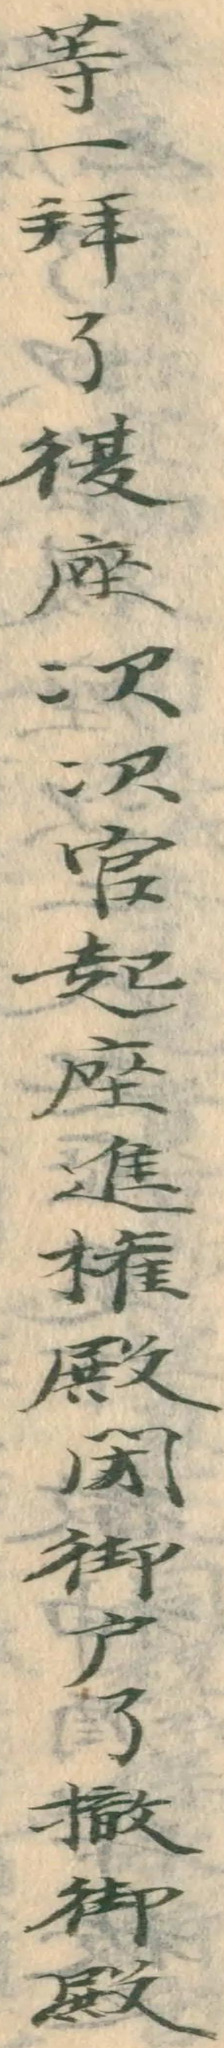等一拝了復座次次官起座進権殿閉御戸了撤御殿
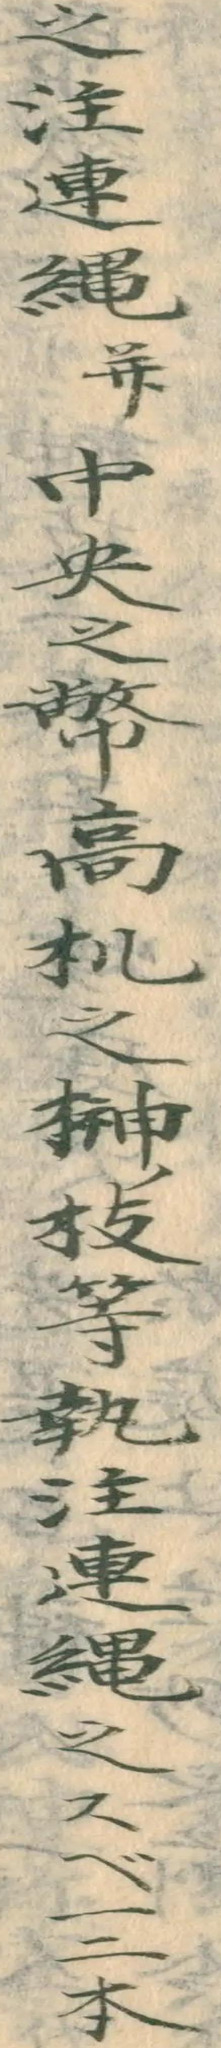之注連縄并中央之幣高机之榊ノ枝等執注連縄之スベ一二本

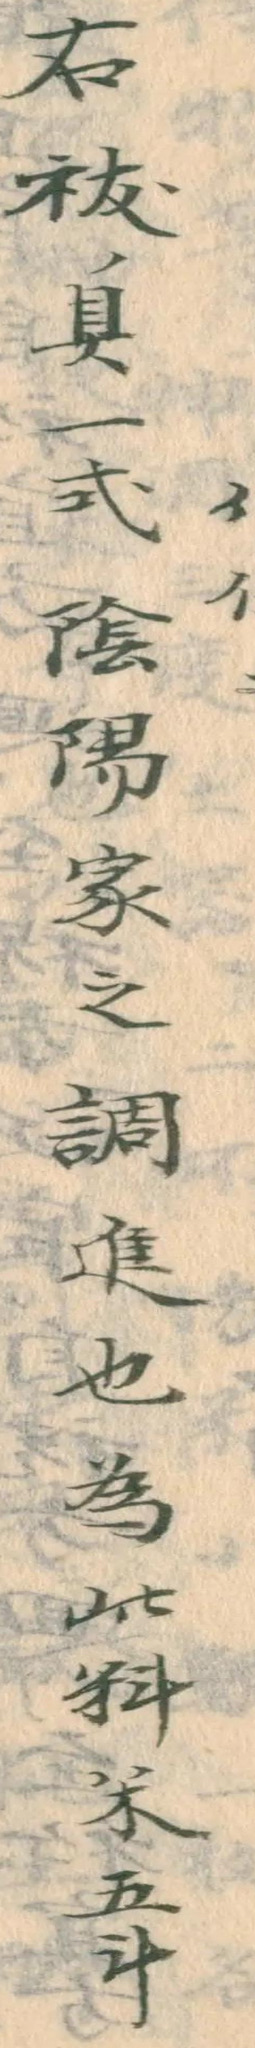右祓ノ具一式陰陽家之調進也為此料米五斗
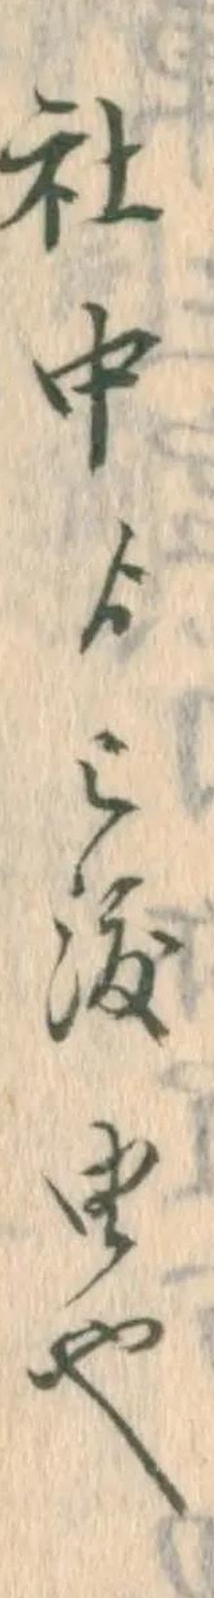社中ゟ被渡由也
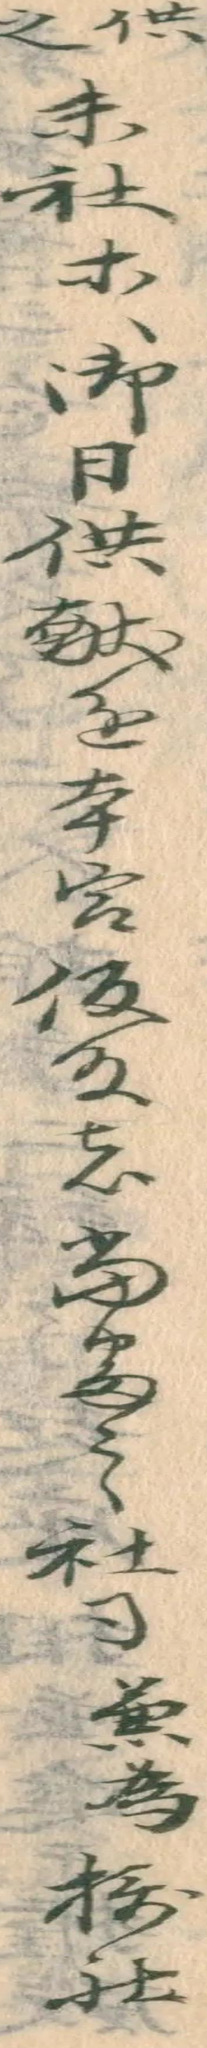供之末社等へ御日供献進本宮仮殿は当番之社司兼為摂社
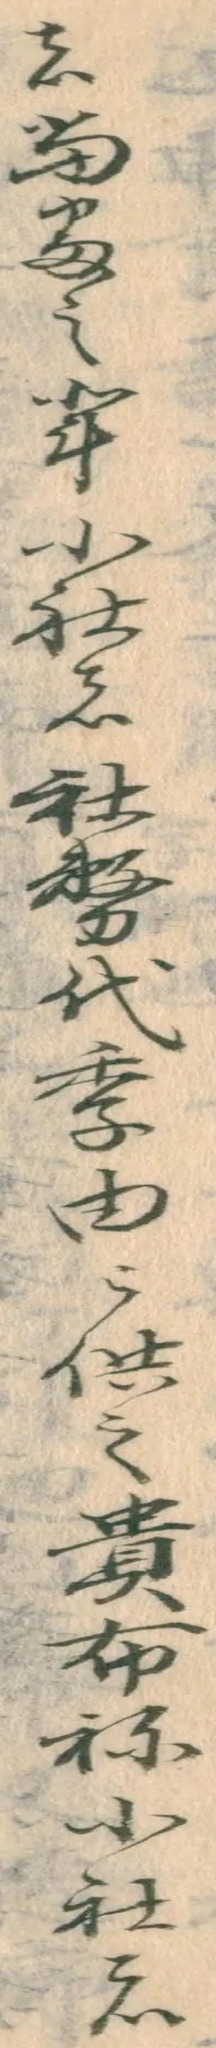は当番之輩小社は社務代季由被供之貴布祢小社は
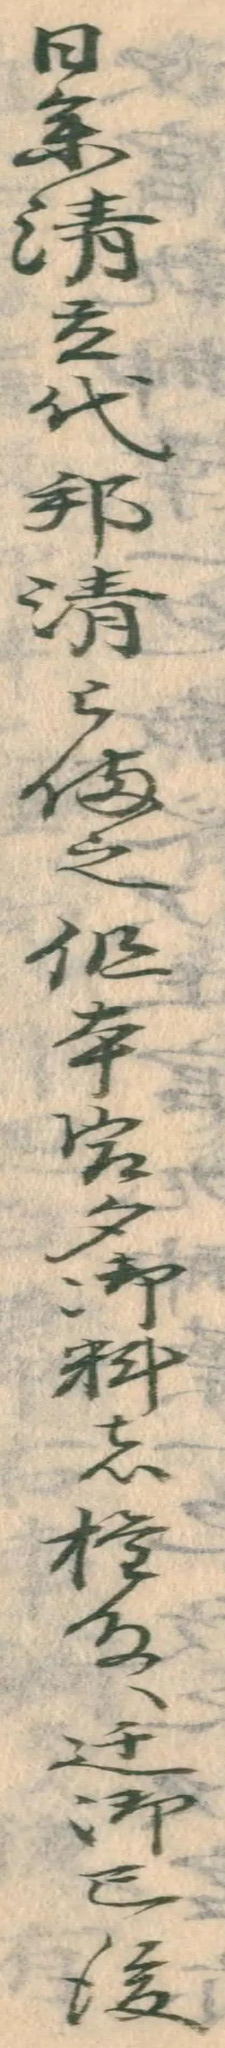日参清立代邦清被備之但本宮夕御料は権殿へ迁御已後
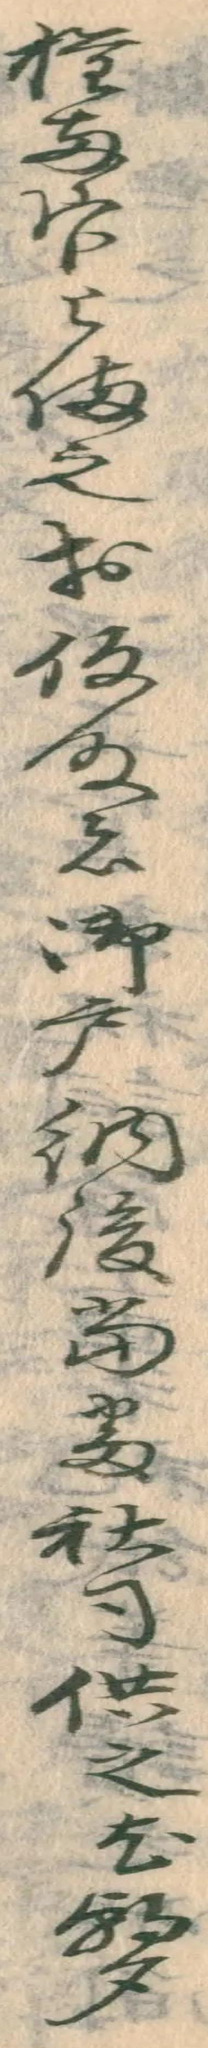権両官被備之於仮殿は御戸納後当番社司供之尤朝多
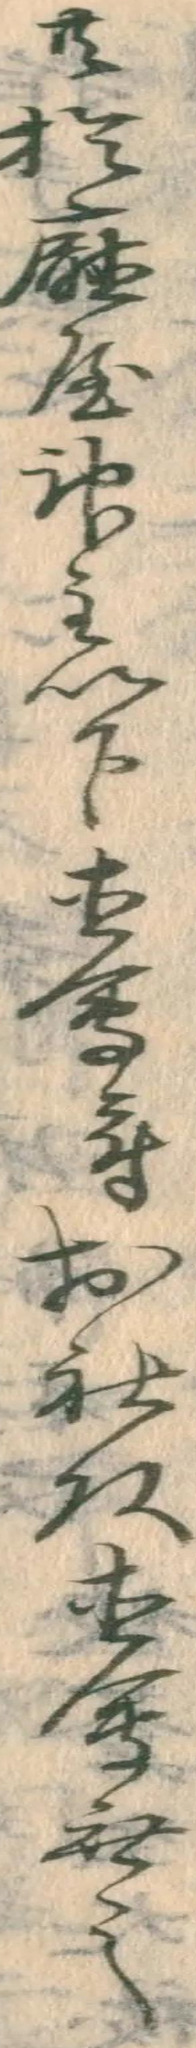共於庁屋神主以下直会ニ付於社頭直会無之
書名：賀茂社記録. 第17冊
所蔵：国立国会図書館 National Diet Library, JAPAN
